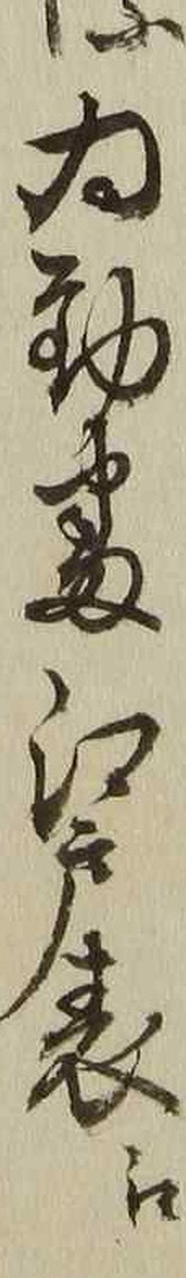詳為勤番江戸表江
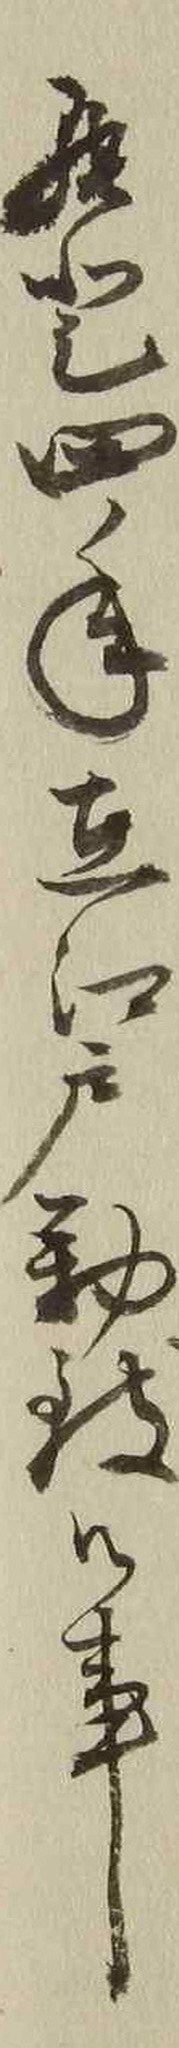罷登四年在江戸勤致候事
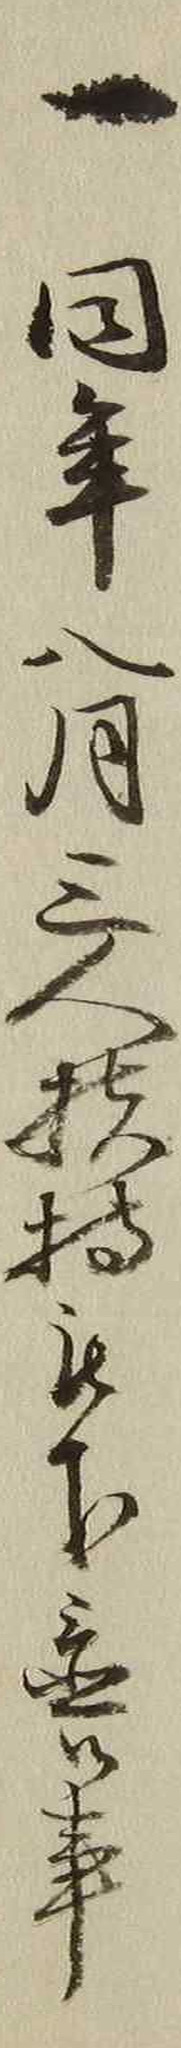一同年八月三人扶持被下置候事
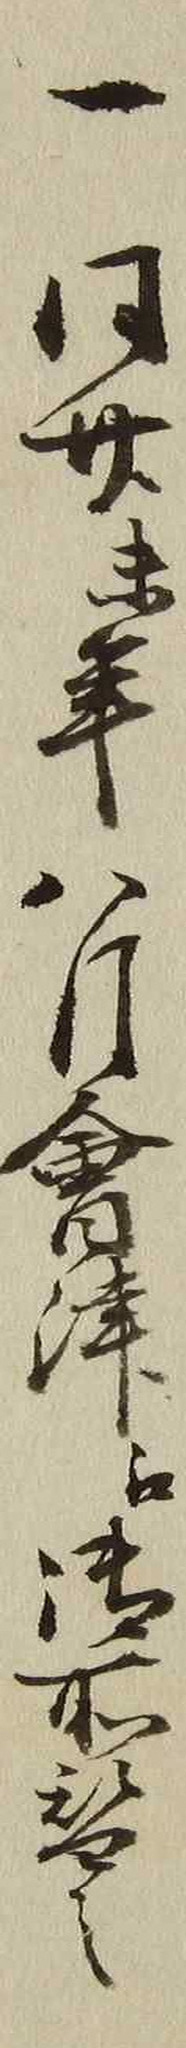一同廿未年八月会津江御所替之
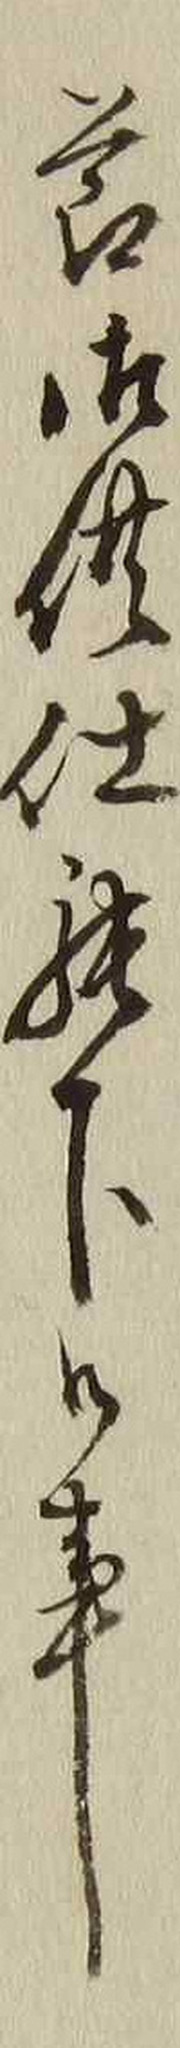節御供仕罷下候事
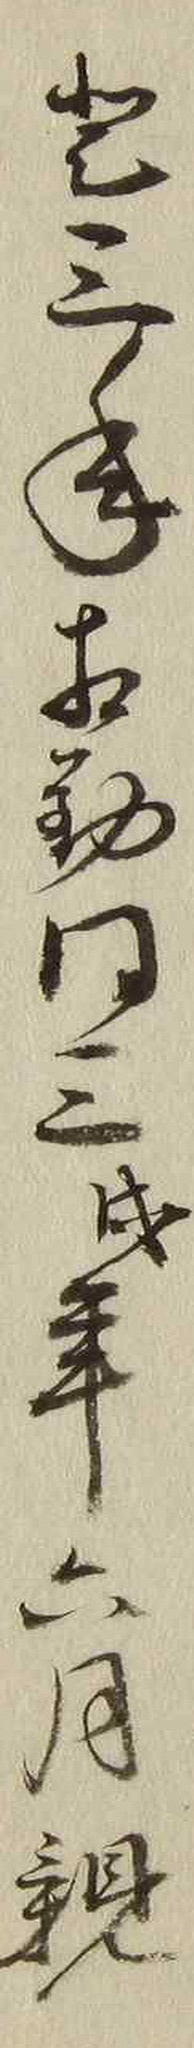登三年相勤同三戌年六月親
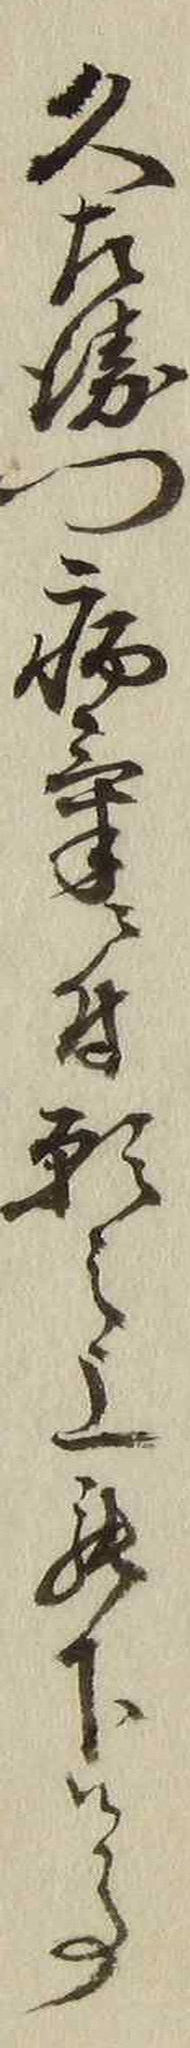久左衛門病気ニ付願之上罷下候事
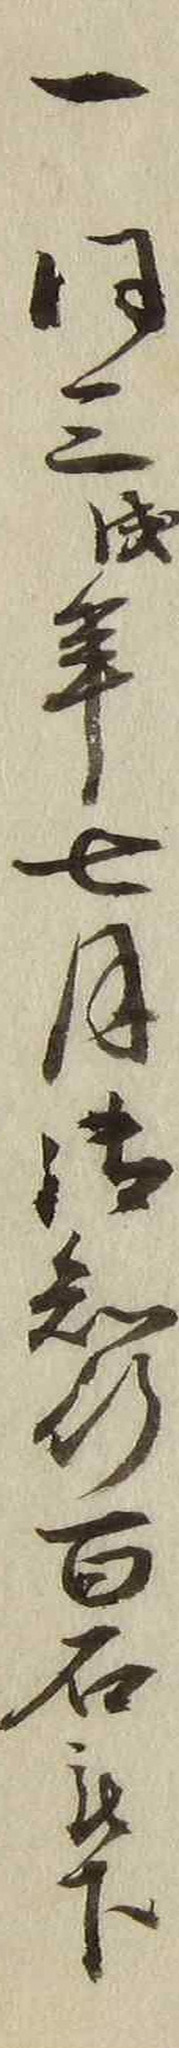一同三戌年七月御知行百石被下
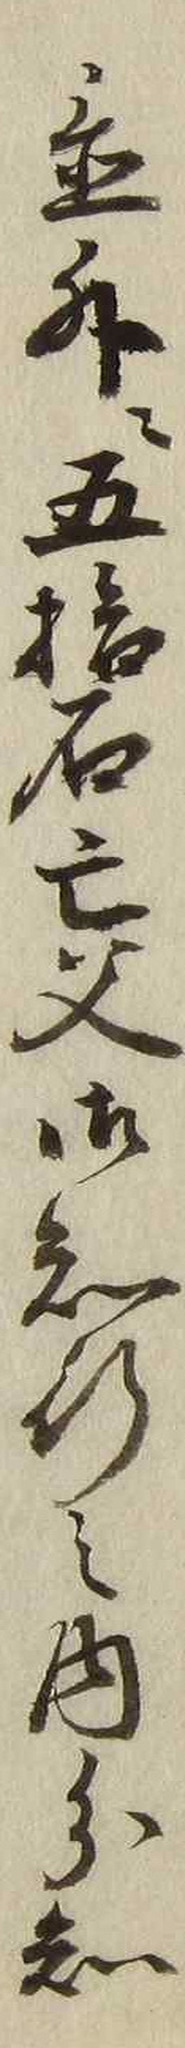置外ニ五拾石亡父御知行之内分知

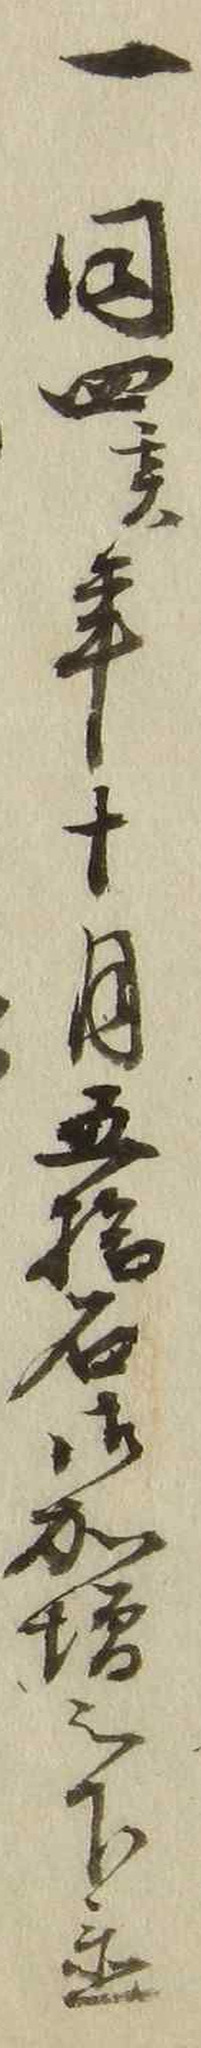一同四亥年十月五拾石御加増被下置
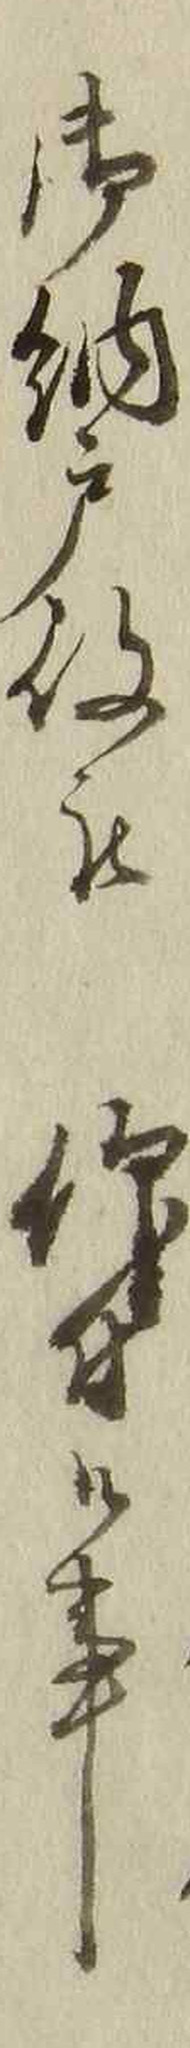御納戸役被仰付候事
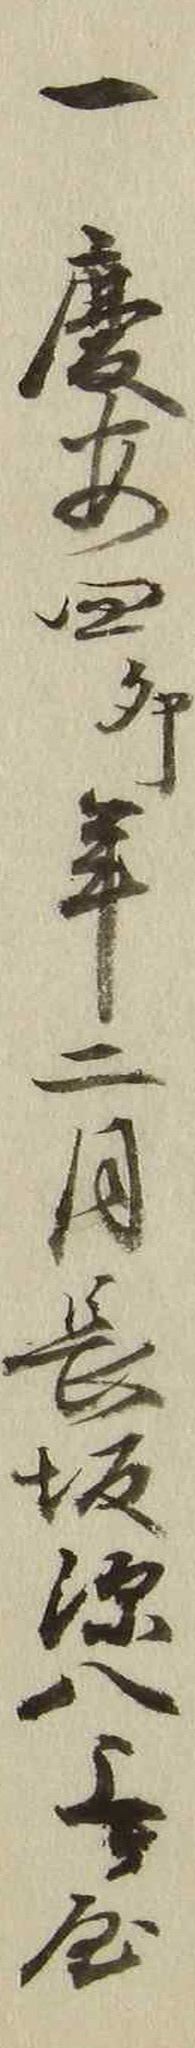一慶安四卯年二月長坂源八上ケ屋
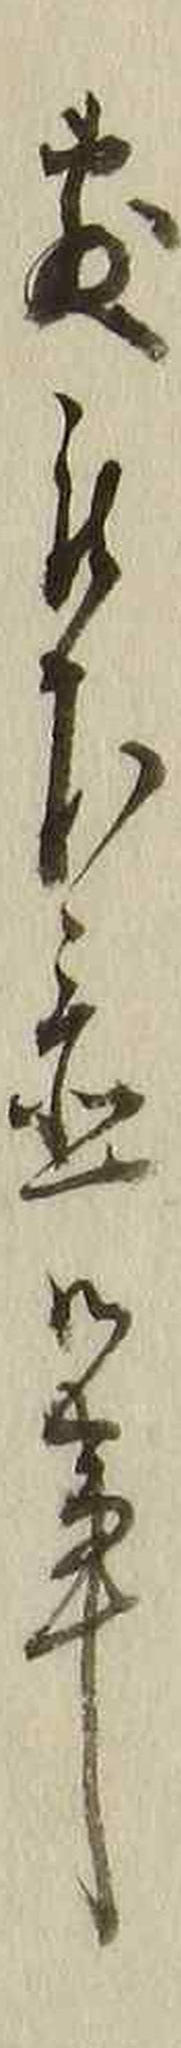敷被下置候事
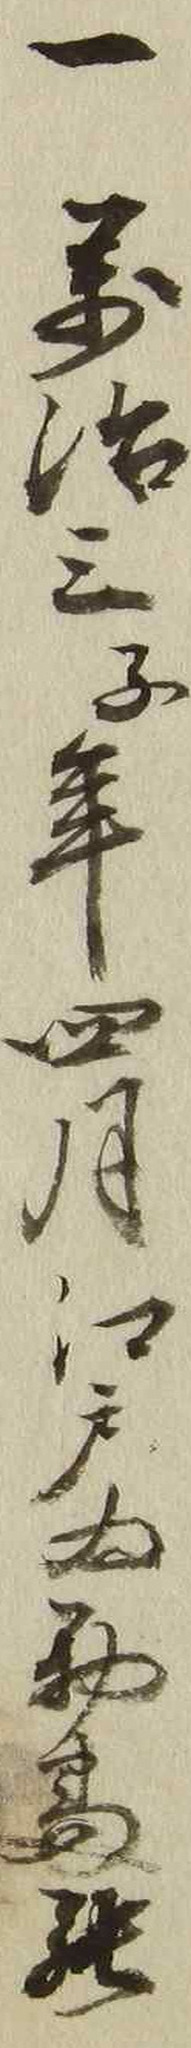一万治三子年四月江戸為勤番罷
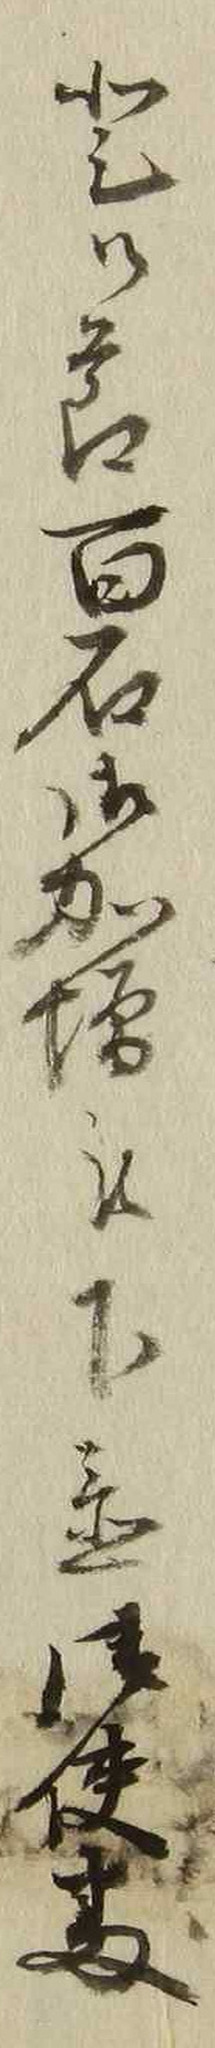登候節百石御加増被下置御使番
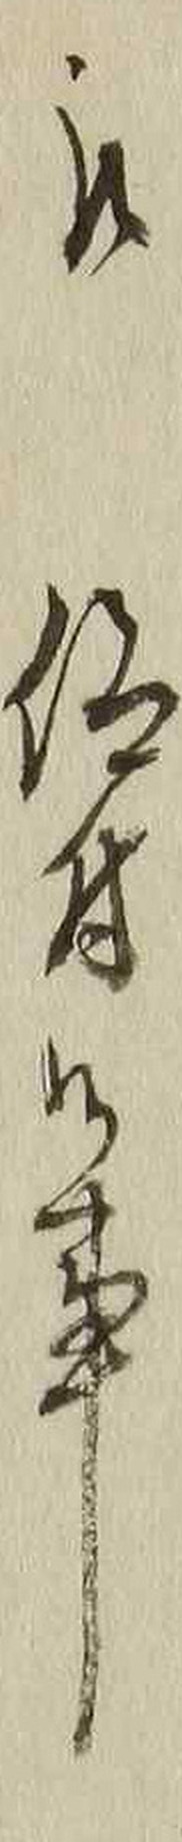被仰付候事
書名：諸士系譜　巻之23　い之部23
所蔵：会津若松市立会津図書館
